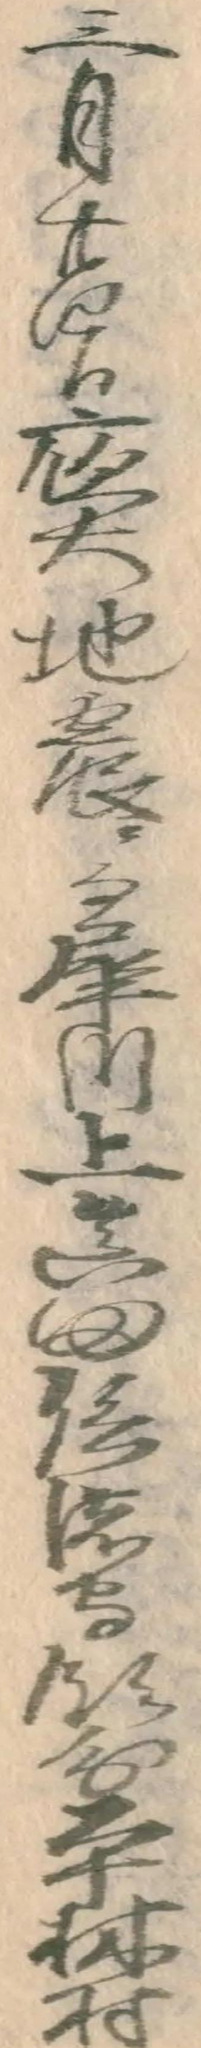三月廿四日夜大地震二而犀川上真田信濃守領分平林村
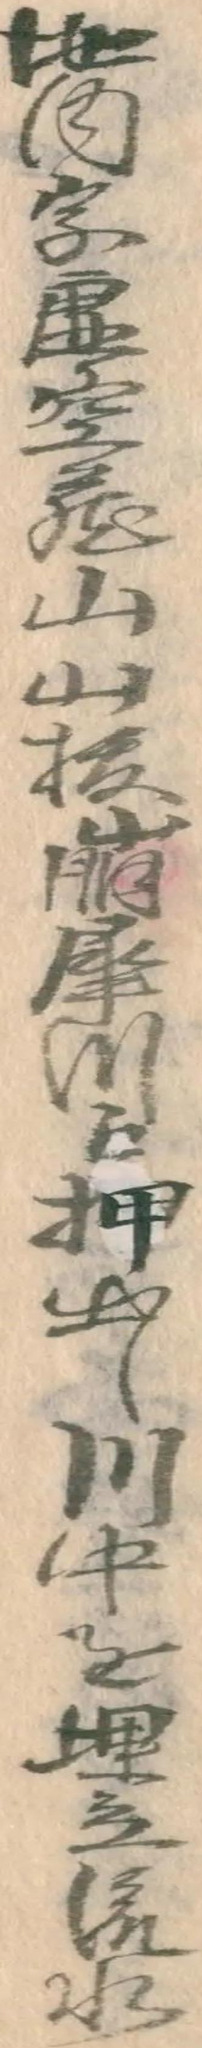地内字虚空蔵山山抜崩犀川江御師出し川中を埋立流水
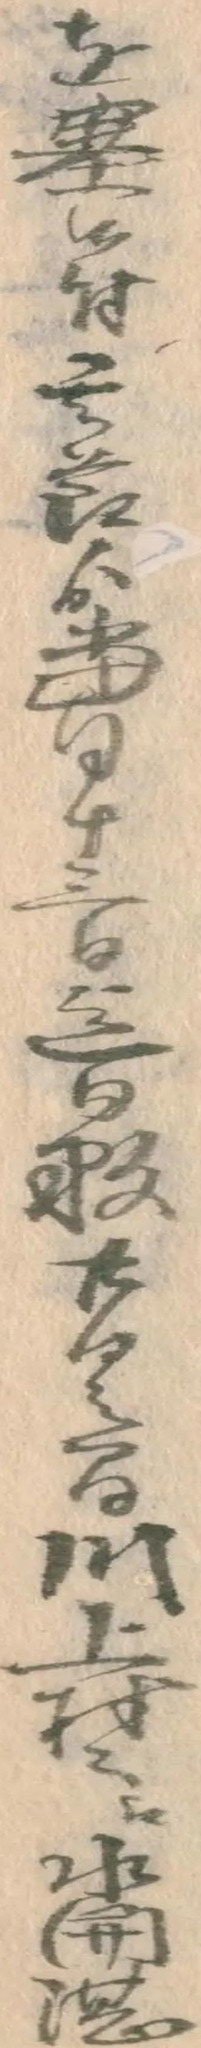を塞候付其節ゟ当月十三日迄日数廿日之間川上村々江水開湛
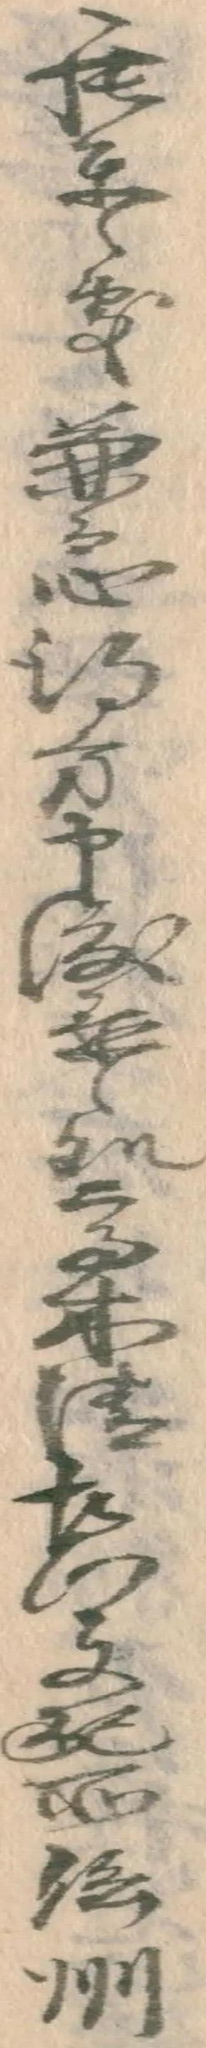罷在候処兼而心得方申渡置処高木清左衛門支配所信州
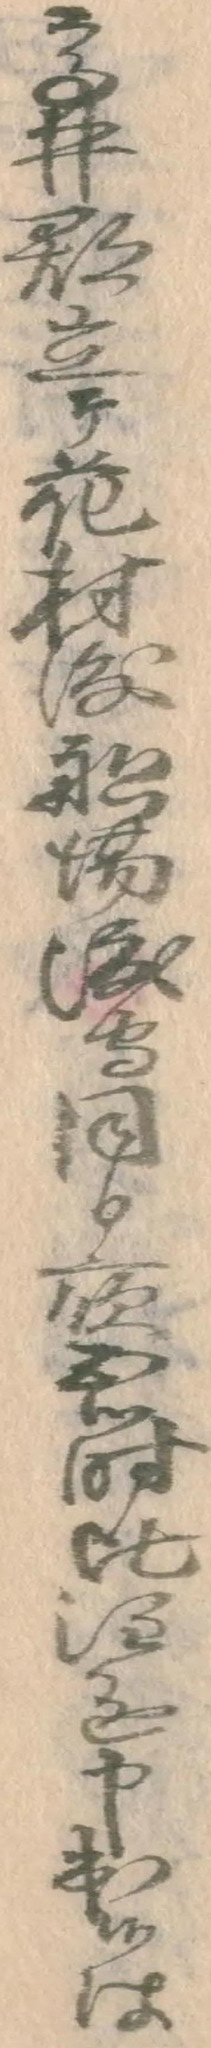高井郡立ヶ花村渡船場守同日夜五ッ時比注進申出候は
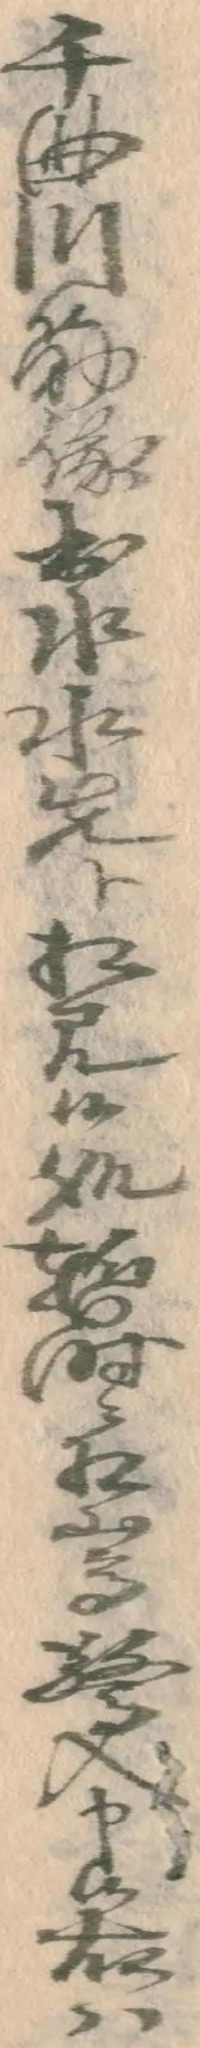千曲川筋俄で出水水先ト相見候処暫時二相嵩驚入申候右ハ
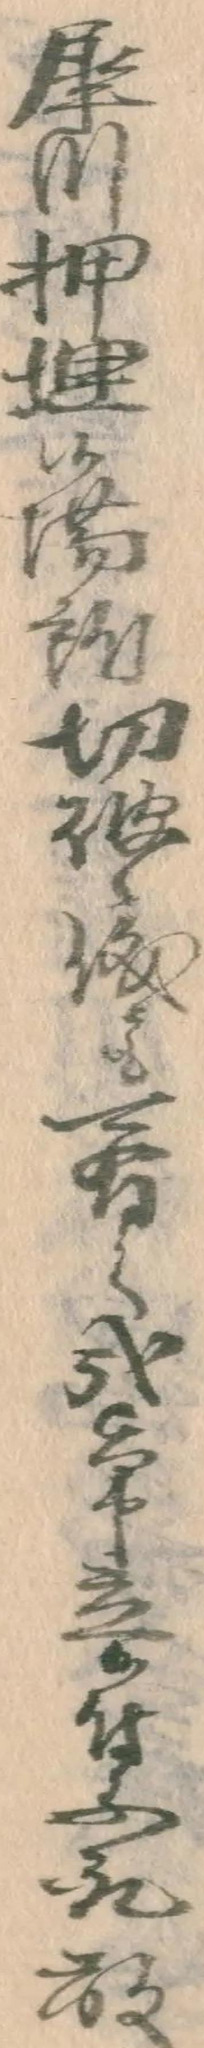犀川押埋候場所切破候儀二も可有之哉と申立候付不取敢
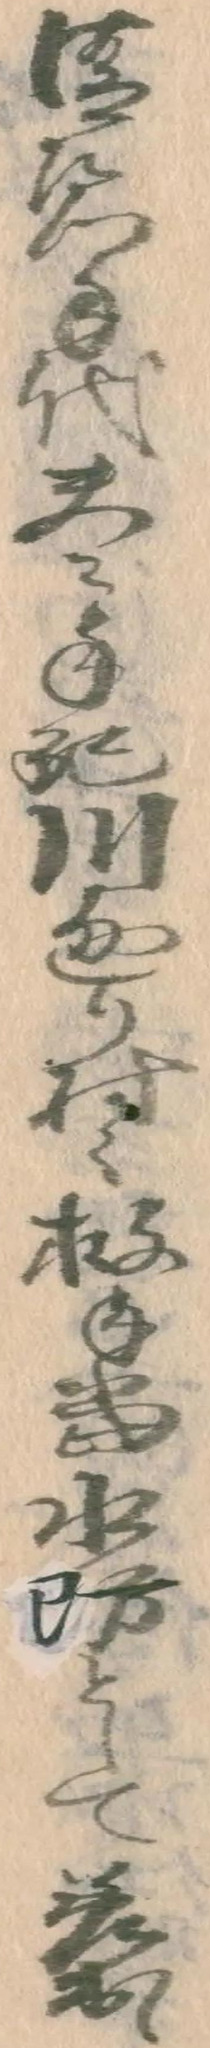清左衛門手代夫々手配川通り村々救手当水防として差出し
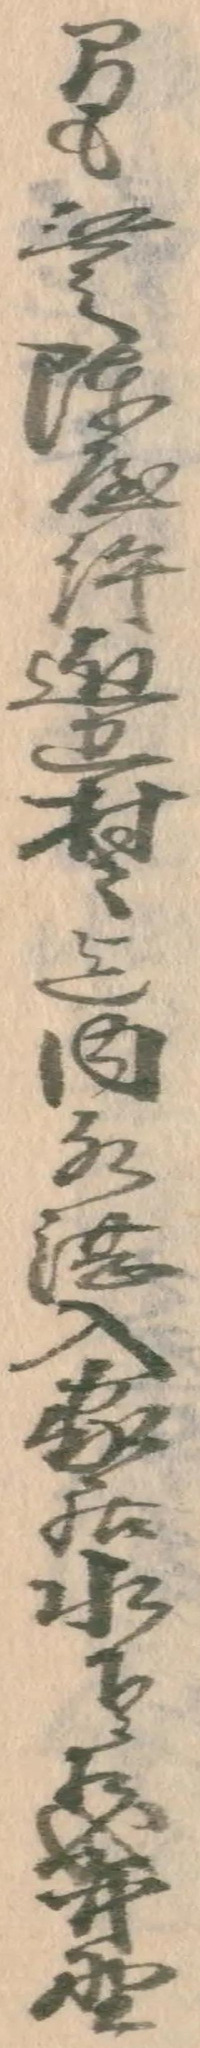間も無之陣屋許近辺村々迄内水湛入家居水下二相成中野
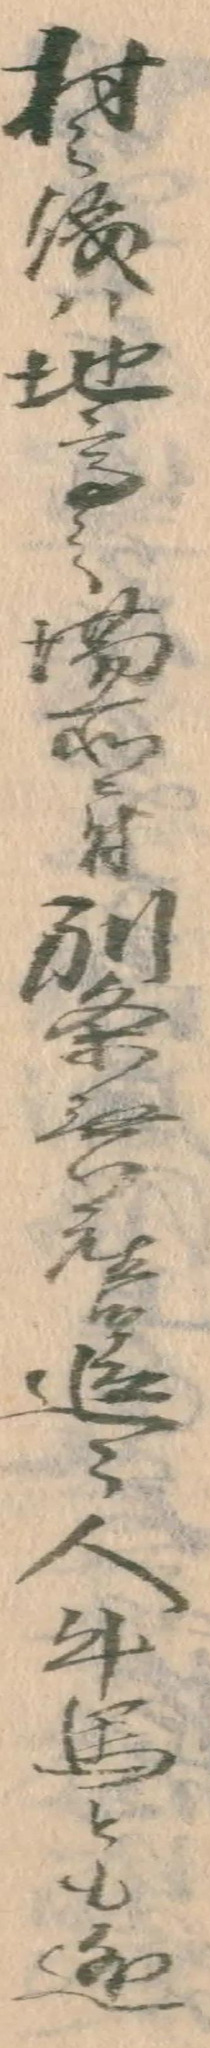村之儀ハ地高之場所二付別条無御座候追々人牛馬とも逃
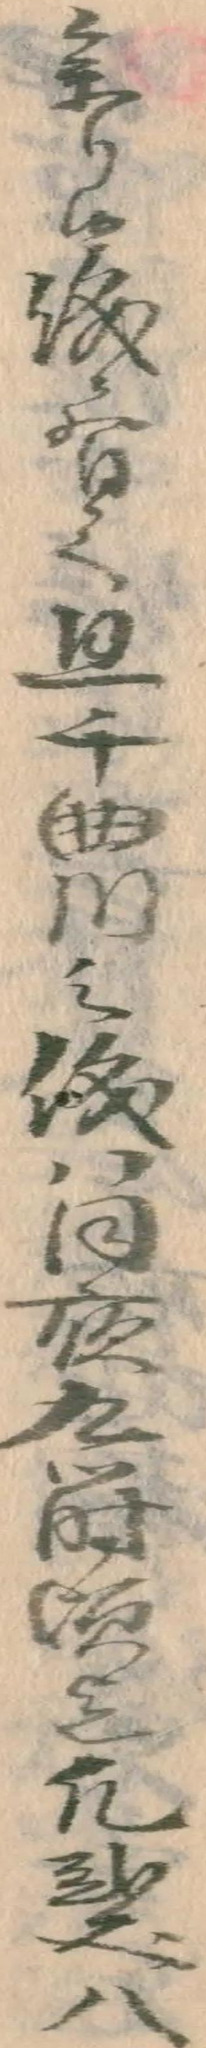参り候儀二有之且千曲川之儀ハ同夜九ッ時頃迄凡弐丈八
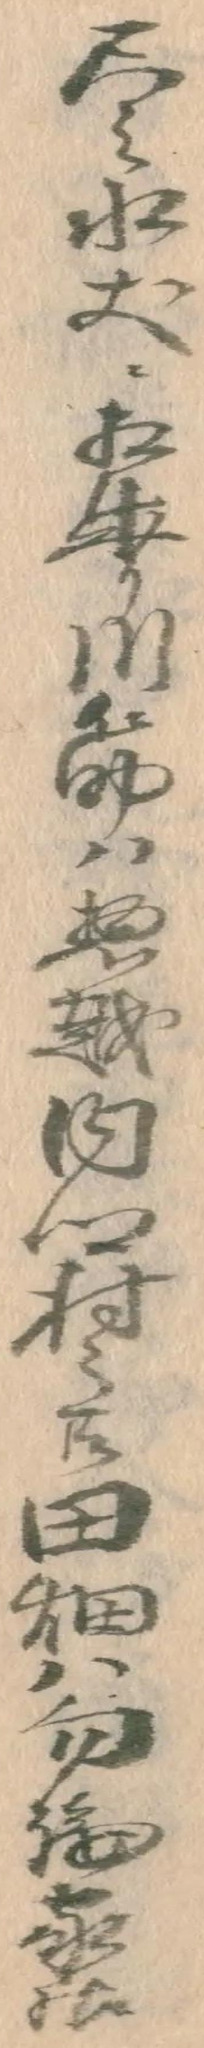尺之水丈二相成川筋ハ惣越内郷村々共田畑ハ勿論家居
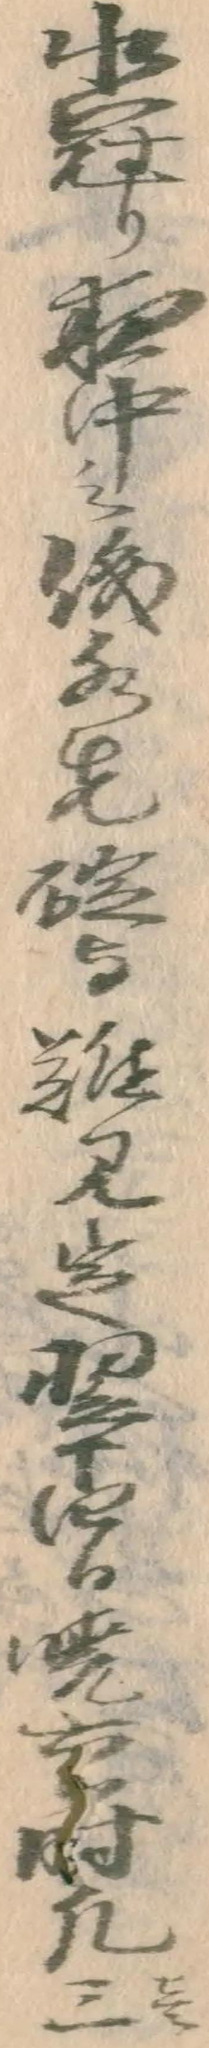水冠り夜中之儀水先̪碇と難見定翌十四日暁六ッ時凡三
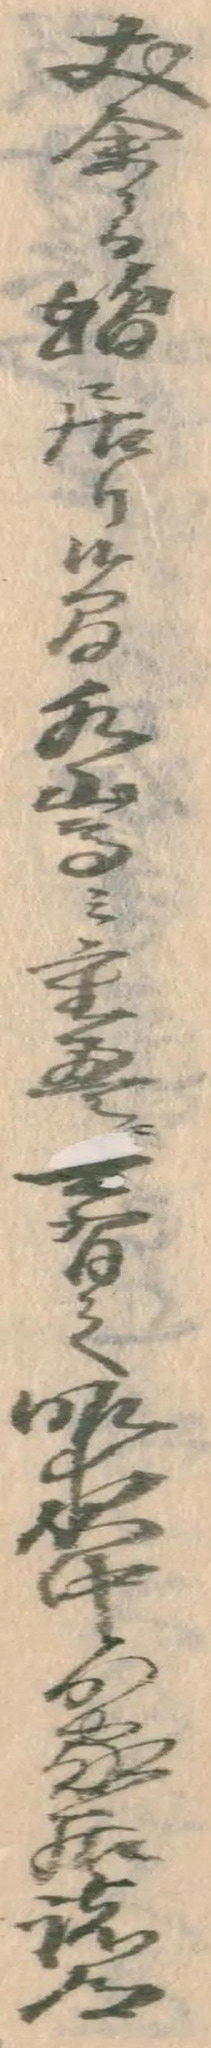丈余二而始居り候間水嵩之重畳二可有之昨夜中ゟ家居諸道
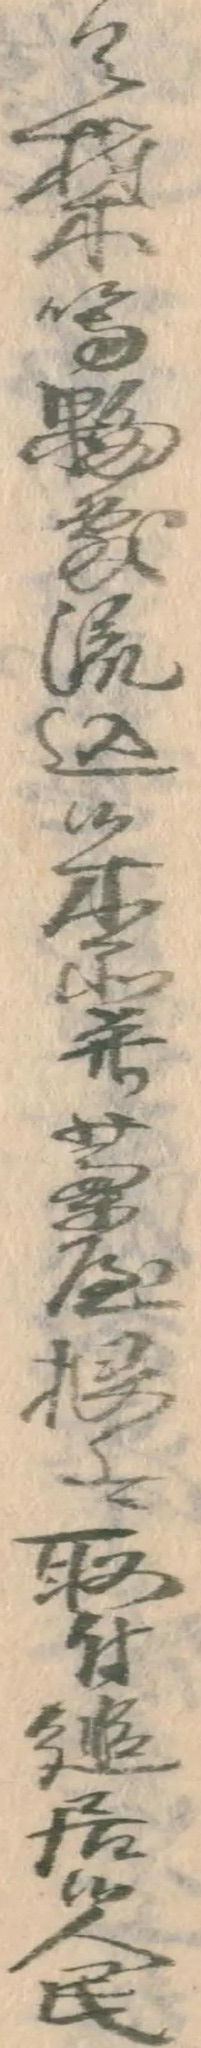具材木等夥敷流込候木品并藁屋根に取付縋居候人民
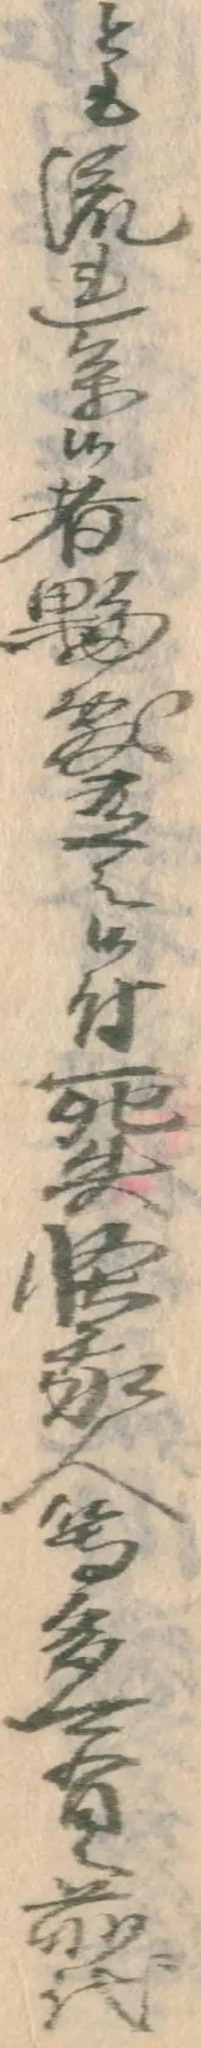とも流れ参候者夥敷有之候付死失怪我人等多可有之前代
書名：信州大地震之記
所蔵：国立国会図書館 National Diet Library, JAPAN
